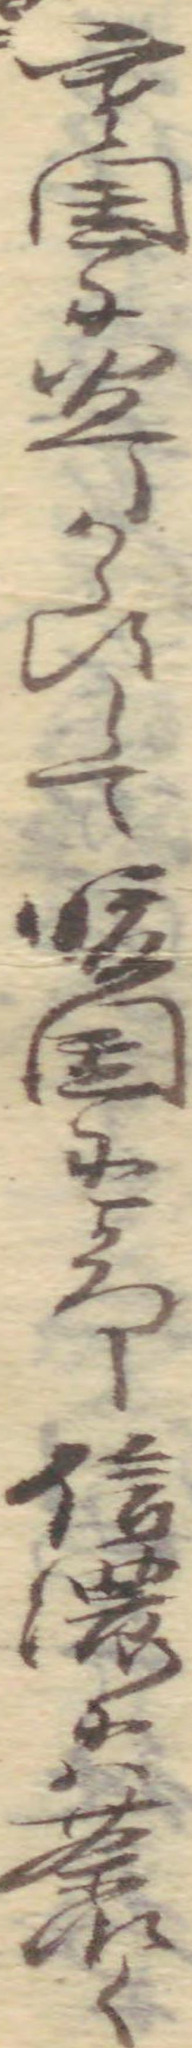寒国に宜しからすして暖国によろし信濃にハ茶なく
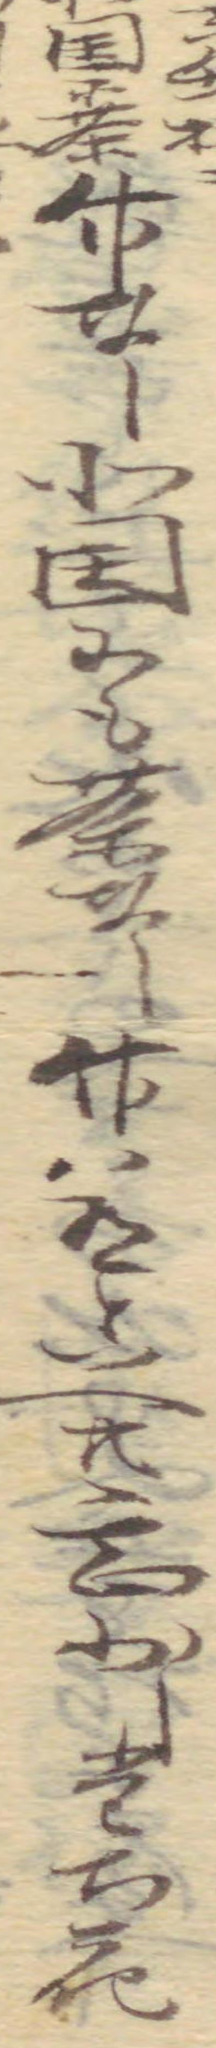竹なし北国にも茶なし竹ハ有といへ共甚だ少したち花
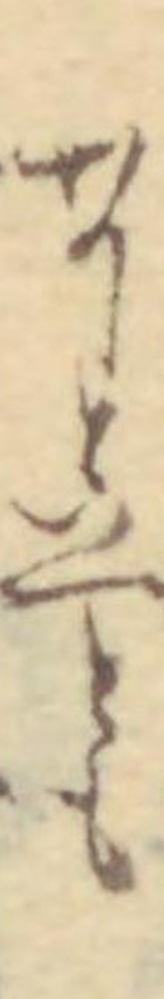なしといへとも
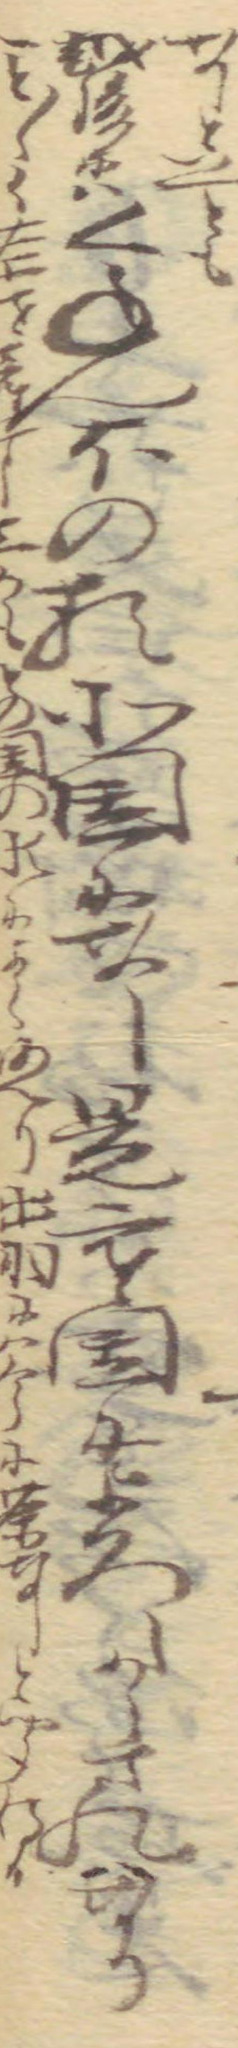くねんほの類北国になし是寒国によろしからされハなり
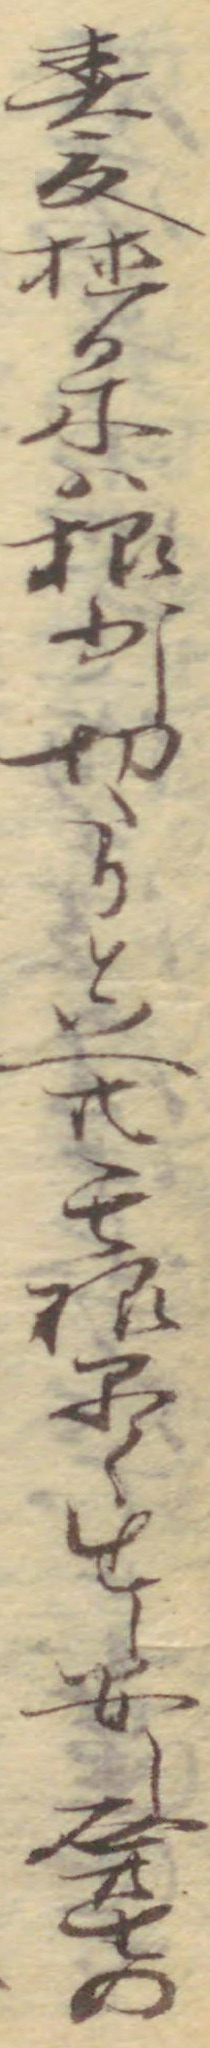春夏植る木は根少し切たりといへ共其根早く生し安し発生の
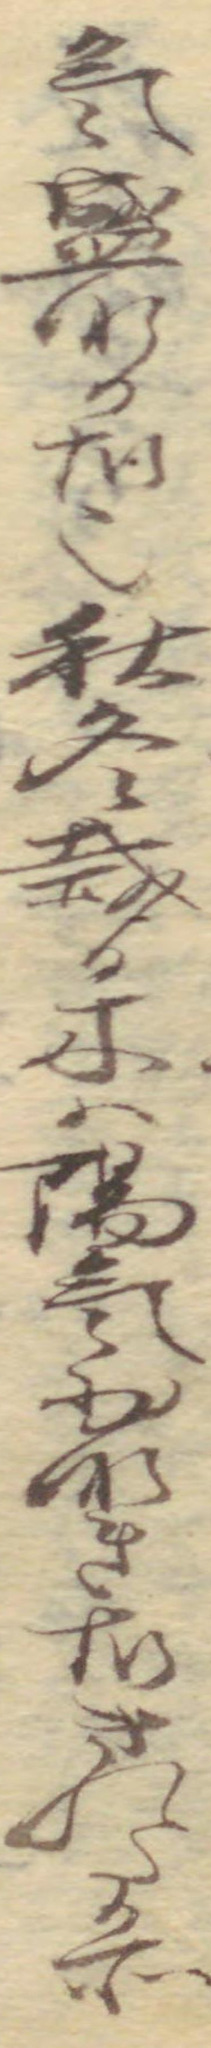気盛なる故也秋冬栽る木ハ陽気少なき故きれたり所
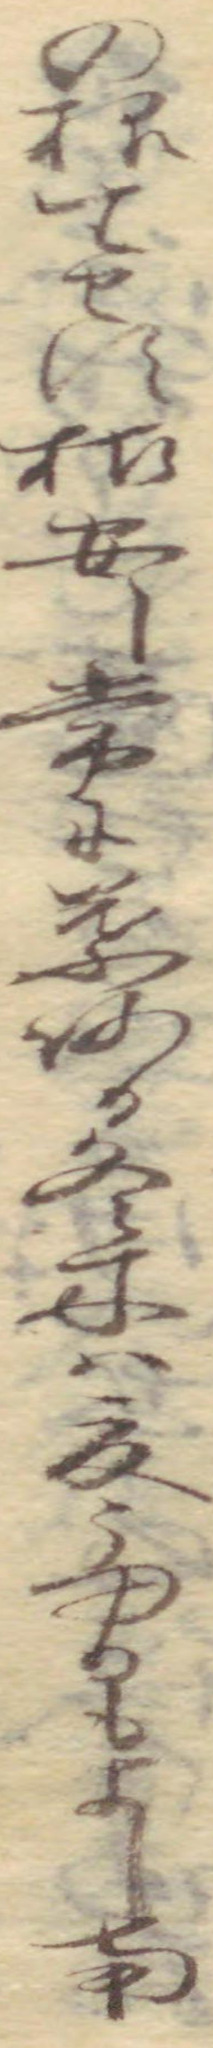の根生せす枯安し常に葉ある冬木ハ夏うゆるもよし南
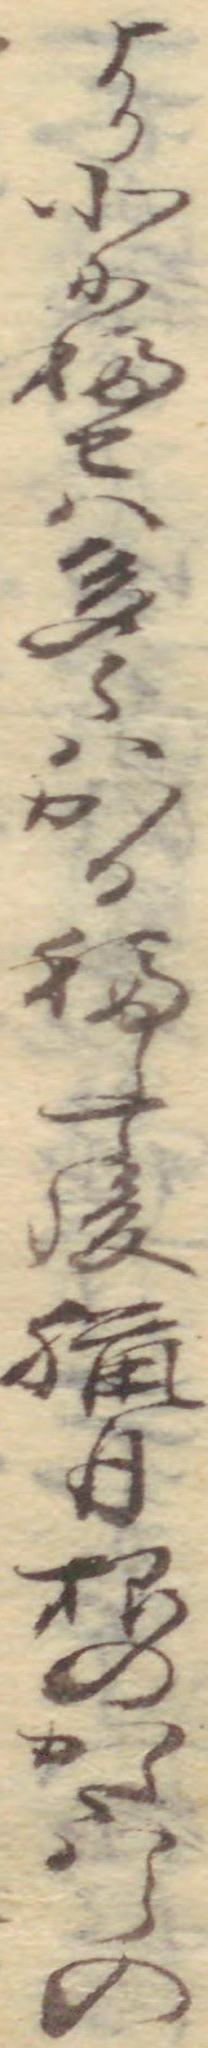より北に移せハ多くハかる移して後猟月根のかたハらの
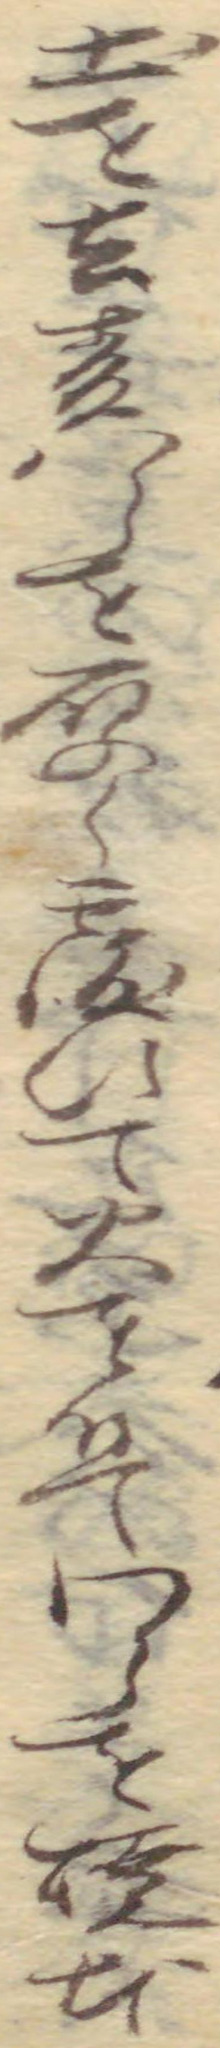土を去麦ハらを厚く覆ひて火をつけてわらを焼本
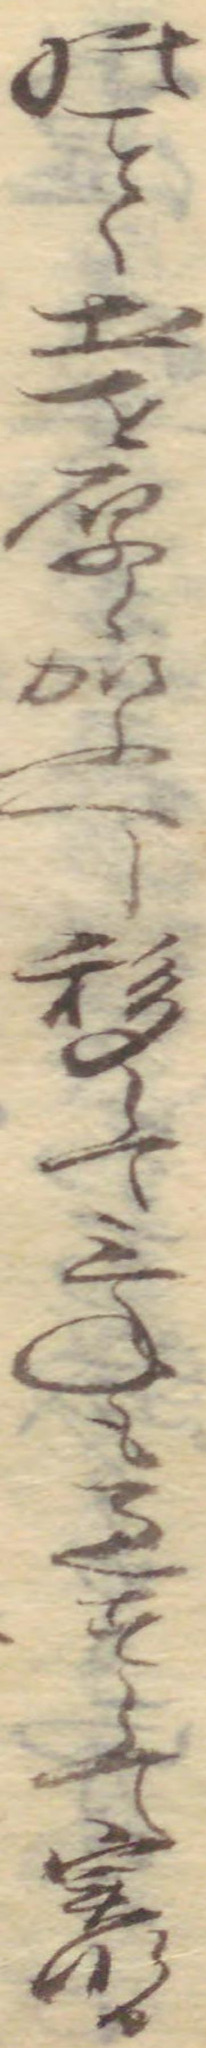のことく土を厚く加ふへし移して三年も過すして実なる
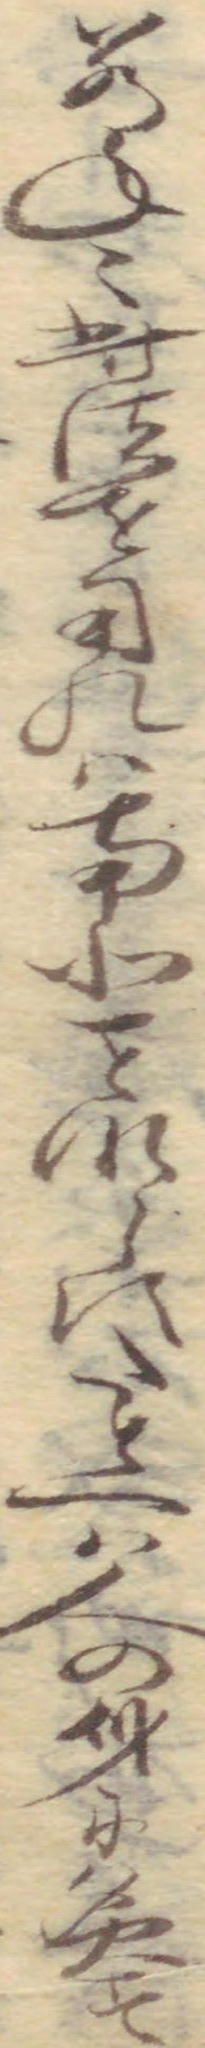若年々此法を用れハ南北ことならすたとへハ人の身に灸す
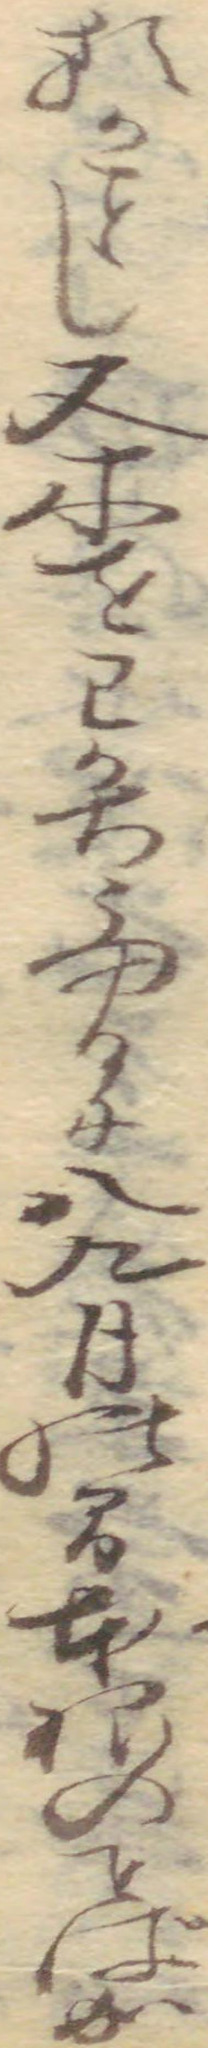るかことし又木をわかちうゆるに八九月の間本根のそばか
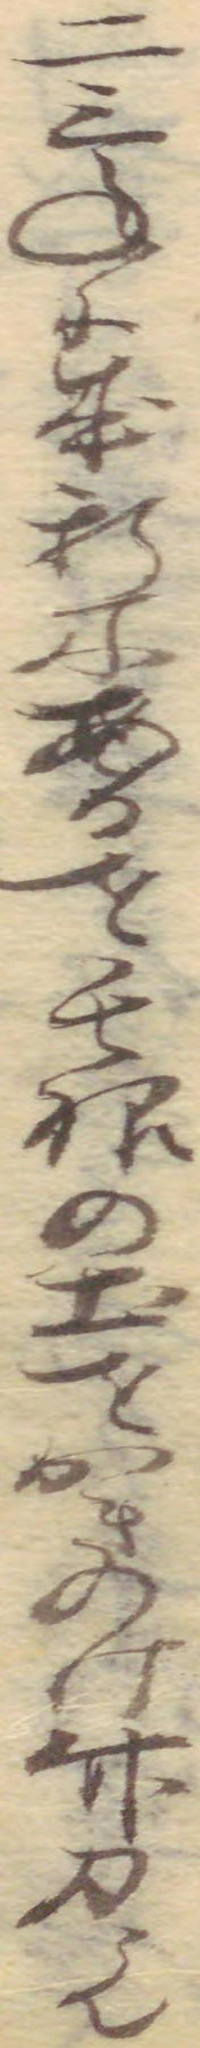二三年に成新木あるを其根の土をかきのけ竹刀二て
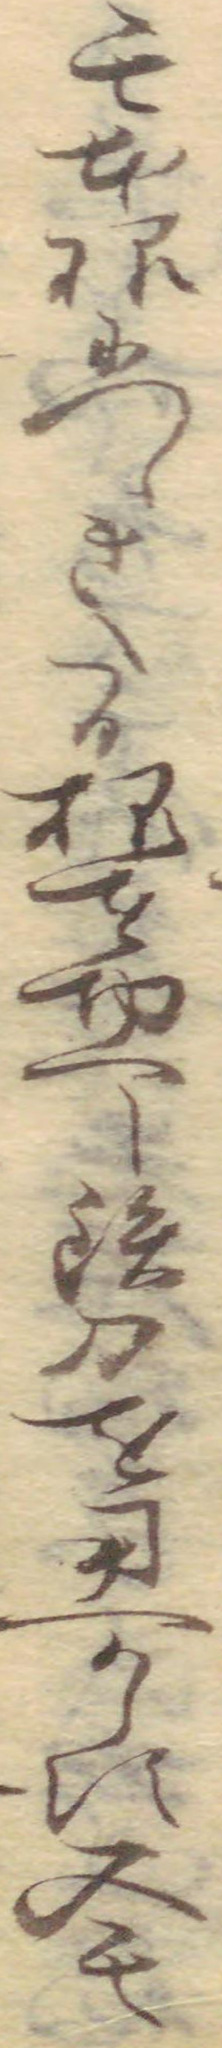其本根につゝきたる根を切へし鉄刀を用へからす又其
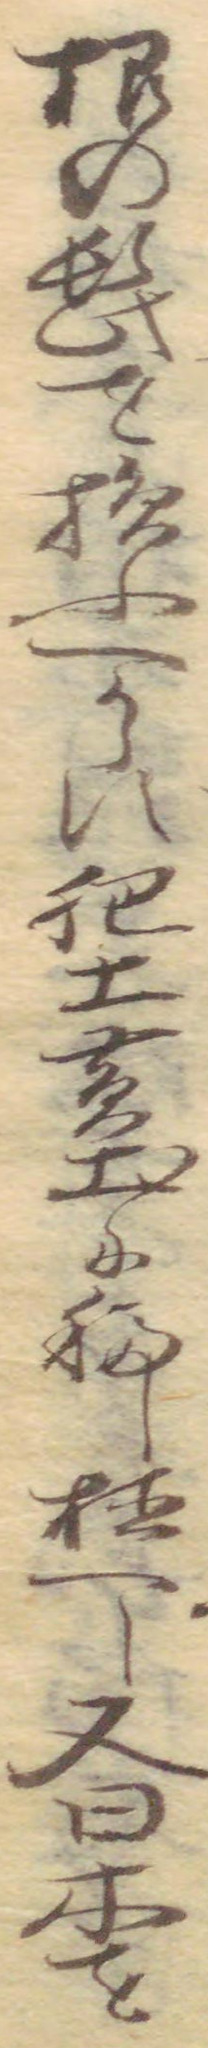根の髭を損ふへからす肥土黄土に移し植へし又曰木を

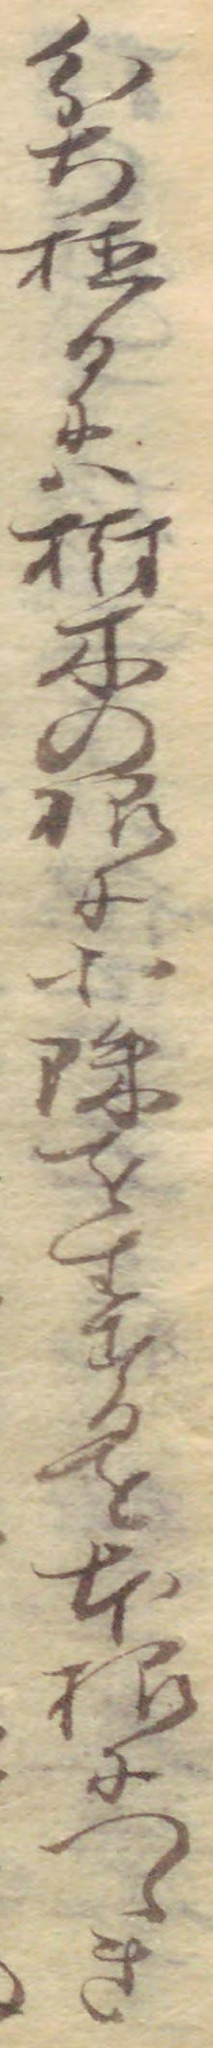分ち植るにハ樹木の根に小珠を生するを本根につゝき
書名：鶯宿雑記. 巻199-200
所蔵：国立国会図書館 National Diet Library, JAPAN
